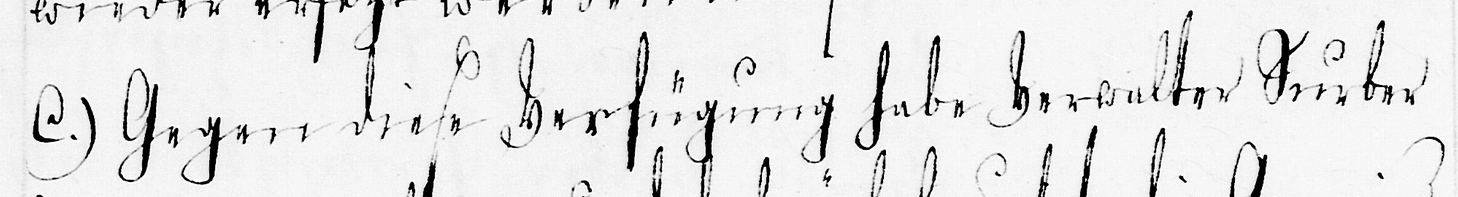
C.) Gegen diese Verfügung habe Verwalter Surber
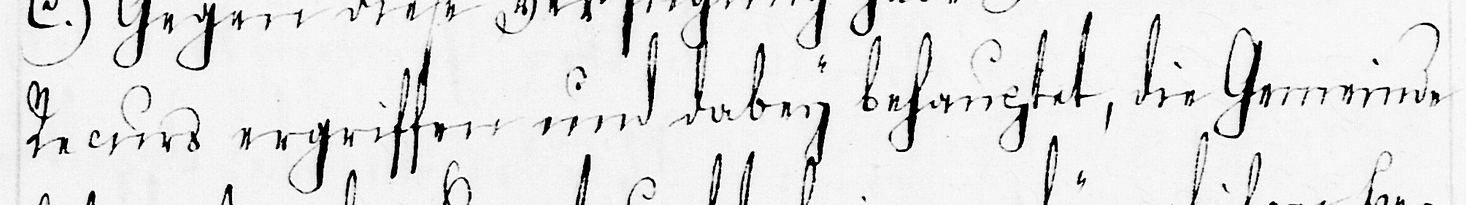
Recurs ergriffen und dabey behauptet, die Gemeinde
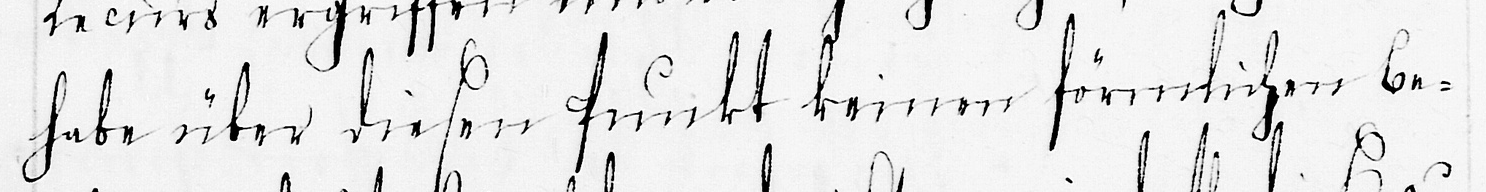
habe über diesen Punkt keinen förmlichen Be¬
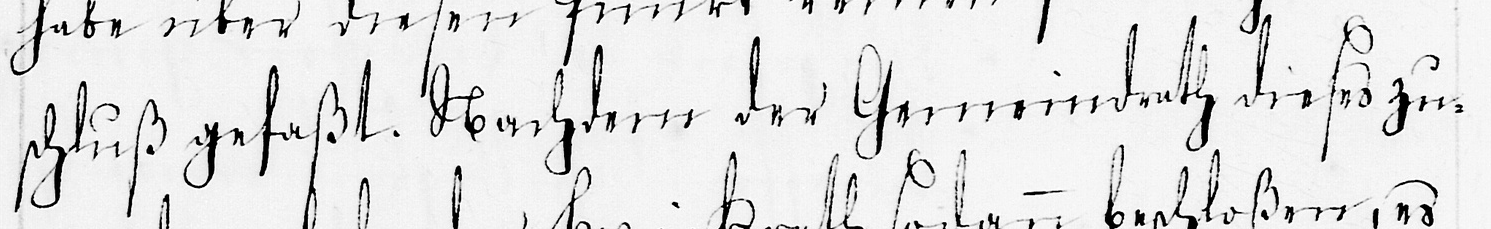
schluß gefaßt. Nachdem der Gemeindrath dieses zu¬
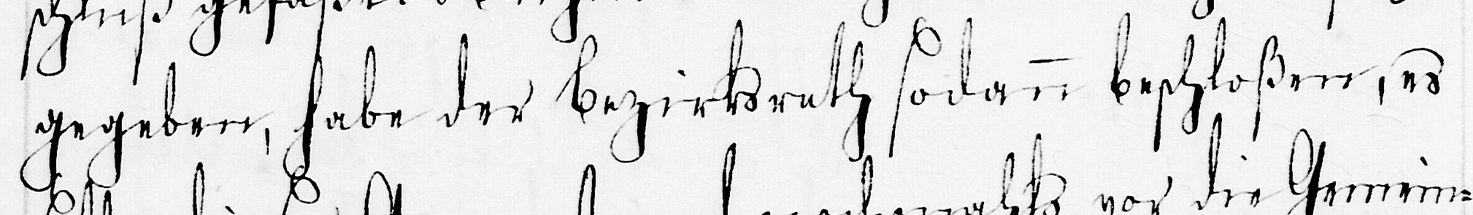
gegeben, habe der Bezirksrath sodann beschloßen, es
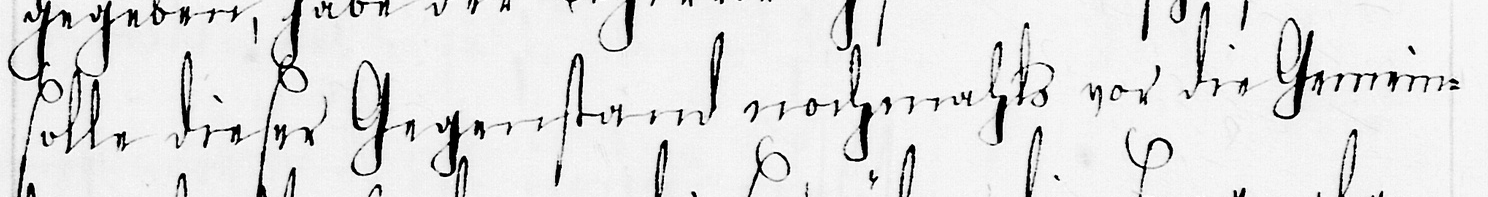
solle dieser Gegenstand nochmahls vor die Gemein¬
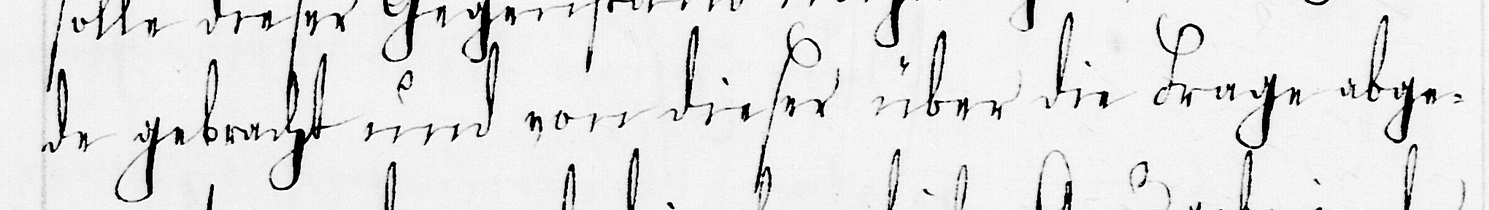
de gebracht und von dieser über die Frage abge¬
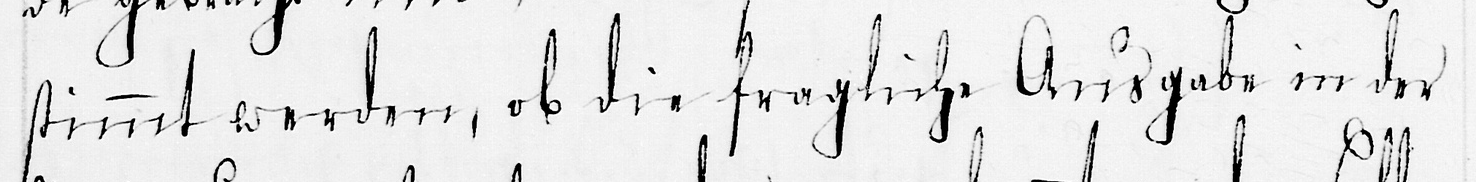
stimmt werden, ob die fragliche Ausgabe in der
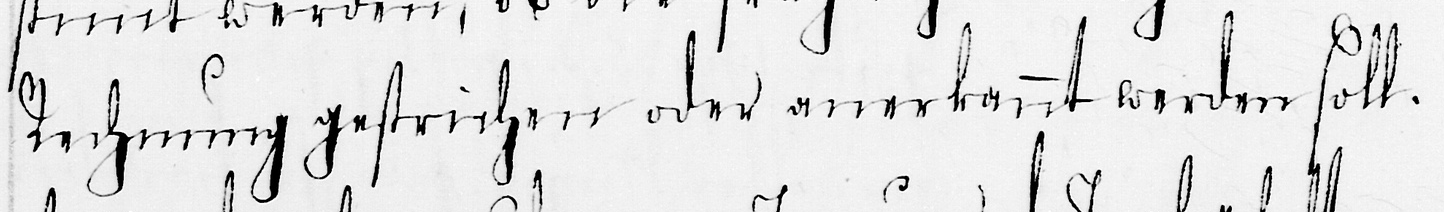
Rechnung gestrichen oder anerkannt werden soll.
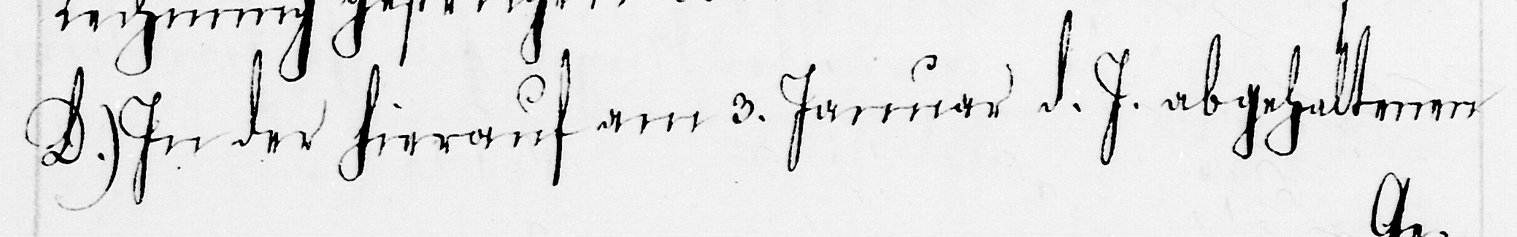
D.) In der hierauf am 3. Januar d. J. abgehaltenen
